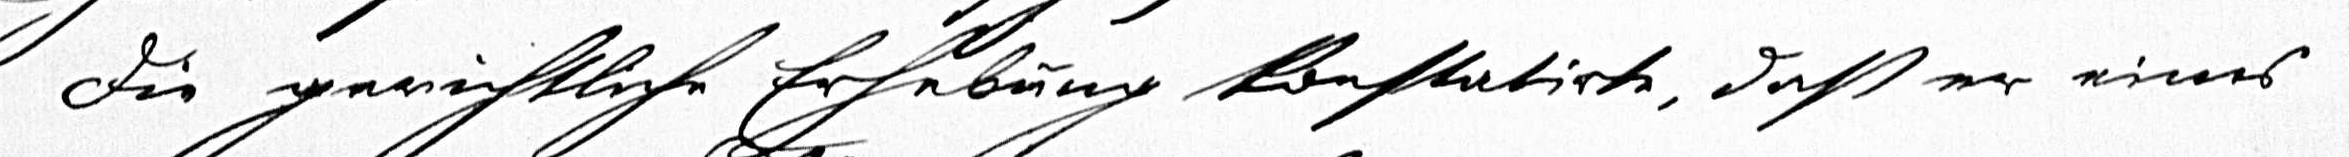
Die gerichtliche Erhebung konstatirte, daß er eines
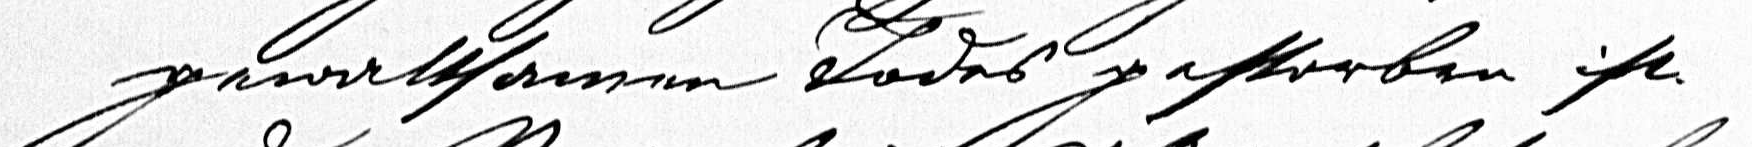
gewaltsamen Todes gestorben ist.
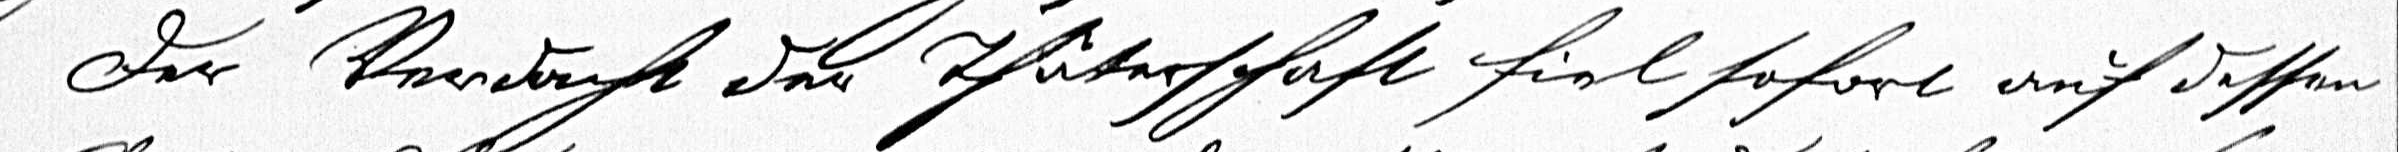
Der Verdacht der Thäterschaft fiel sofort auf dessen
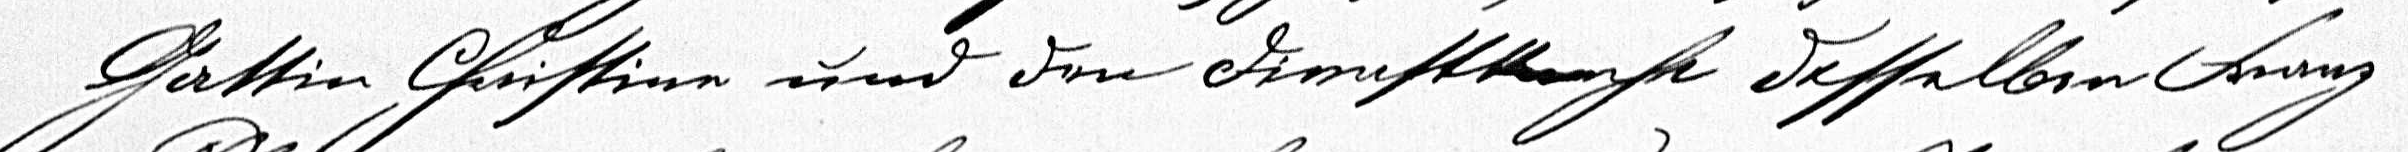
Gattin Christine und den Dienstknecht desselben Franz
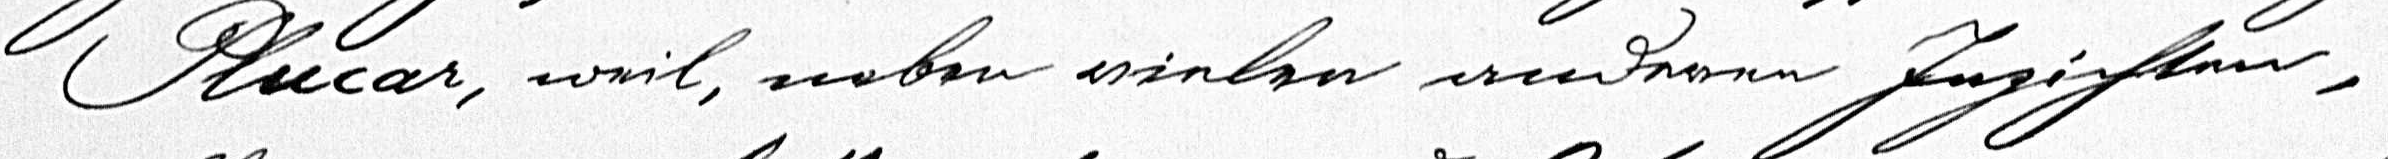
Plucar, weil, neben vielen anderen Jezichten,
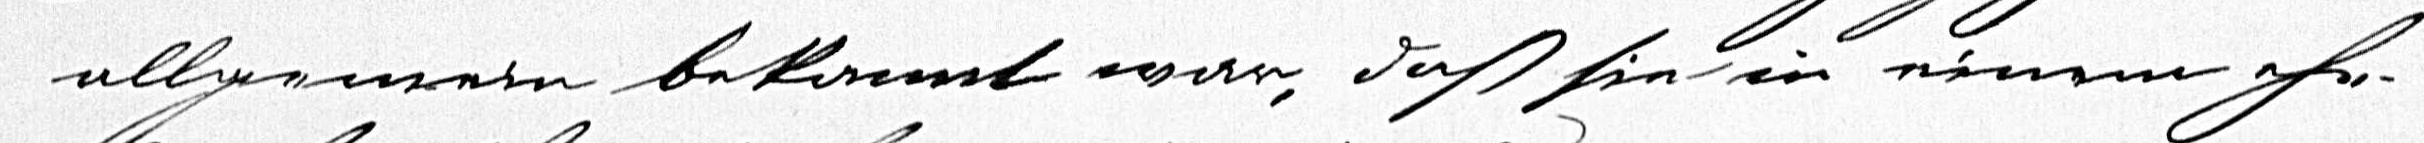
allgemein bekannt war, daß sie in einem ehe¬
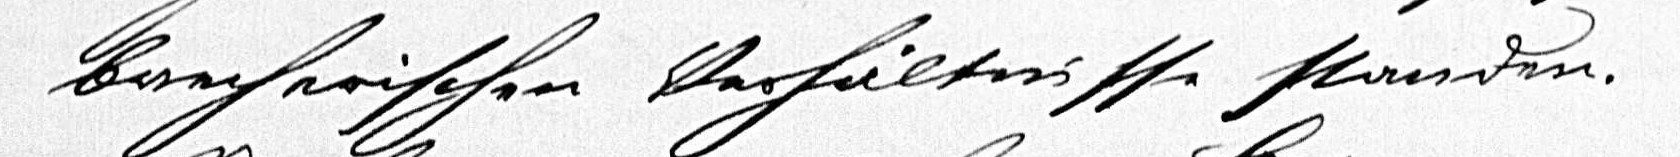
brecherischen Verhältnisse standen.
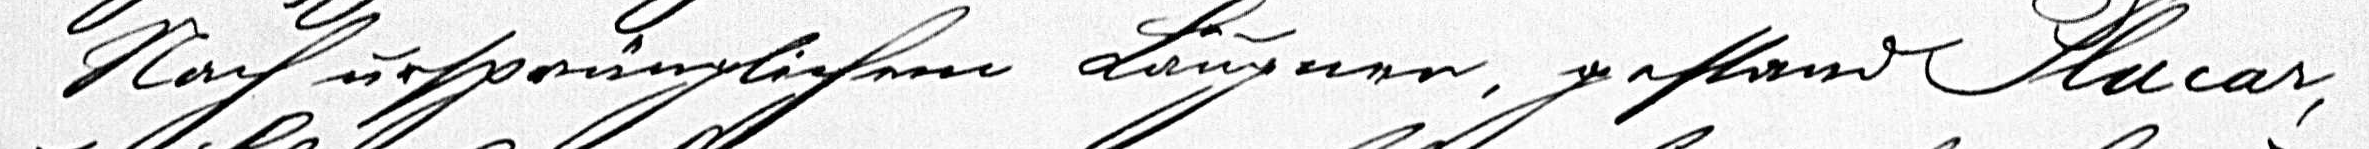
Nach ursprünglichem Läugnen, gestand Plucar,
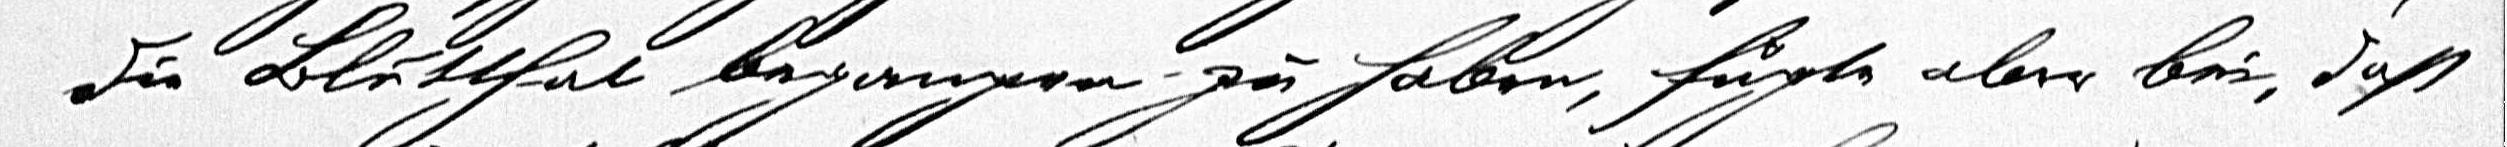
die Blutthat begangen zu haben, fugte aber bei, daß
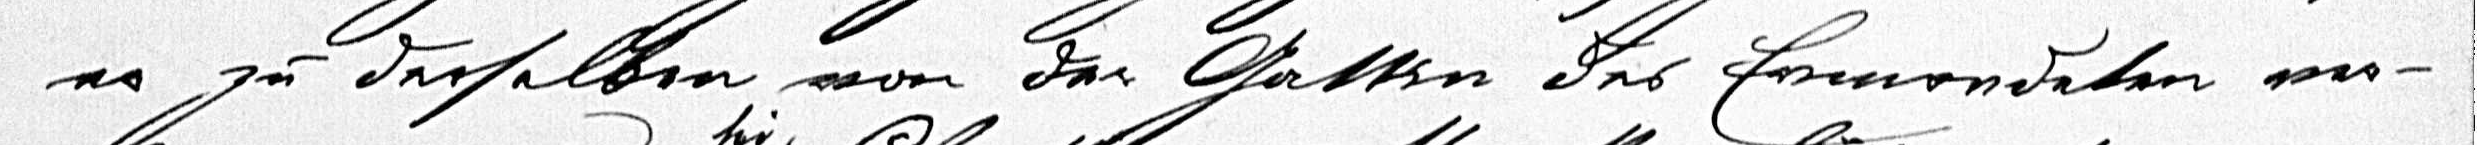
er zu derselben von der Gattin des Ermordeten ver¬
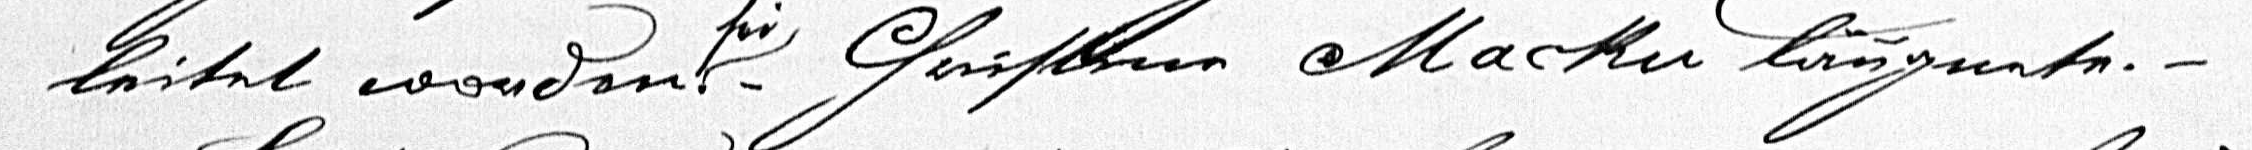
leitet worden sei.- Christine Macku läugnete.-
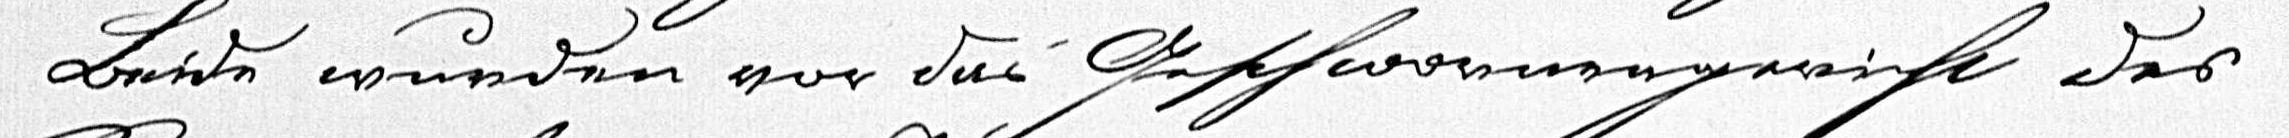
Beide wurden vor das Geschwornengericht des
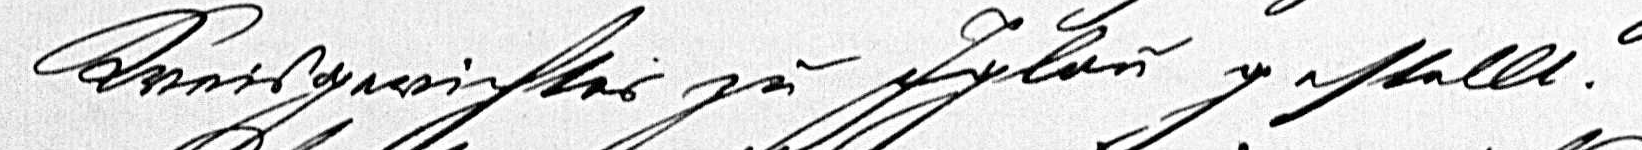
Kreisgerichtes zu Jplau gestellt.
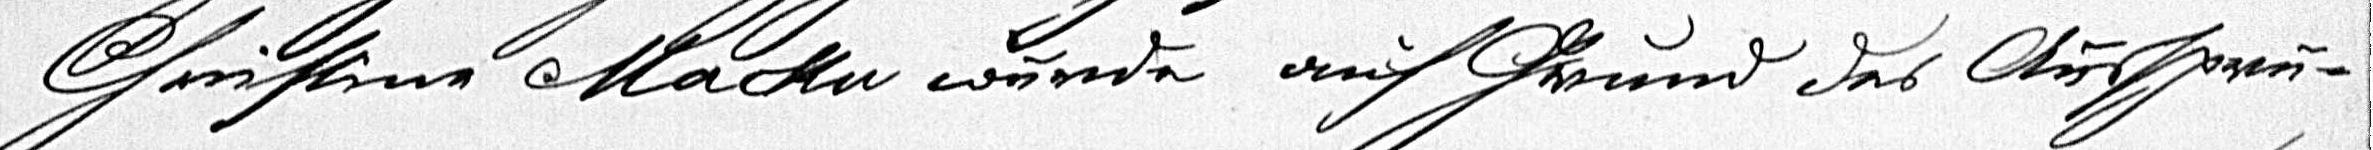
Christine Macku wurde auf Grund des Ausspru¬
